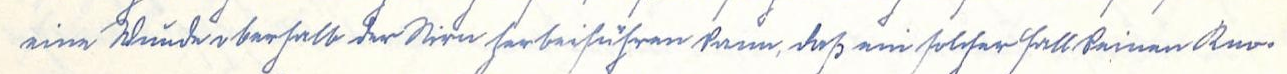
eine Wunde oberhalb der Stirn herbeiführen kann, dass ein solcher Fall keinen Kno-
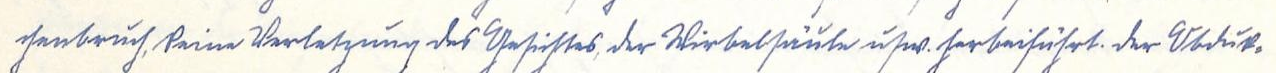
chenbruch, keine Verletzung des Gesichtes, des der Wirbelsäule usw. herbeiführt. Der Obduk
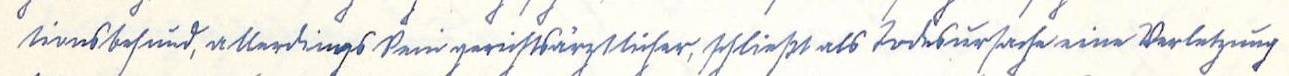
tionsbefund, allerdings kein gerichtsärztlicher, schließt als Todesursache eine Verletzung
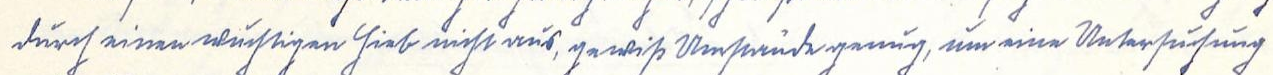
durch einen wuchtigen Hieb nicht aus, gewiß Umstände genug, um eine Untersuchung
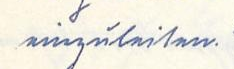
einzuleiten.
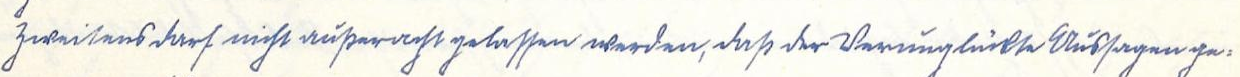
Zweitens darf nicht über außeracht gelassen werden, dass der Verunglückte Aussagen ge-
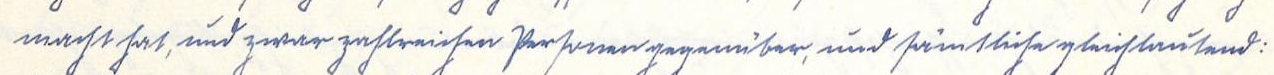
macht hat, und zwar zahlreichen Personen gegenüber, und sämtliche gleichlautend:
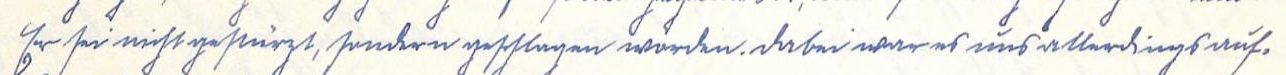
Er sei nicht gestürzt, sondern geschlagen worden. Dabei war es uns allerdings auf-
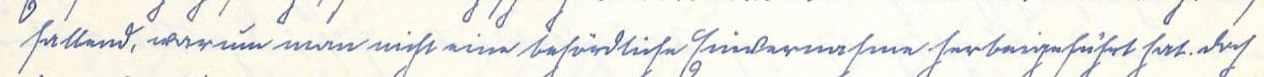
fallend, warum man nicht eine behördliche Einvernahme herbeigeführt hat. Doch
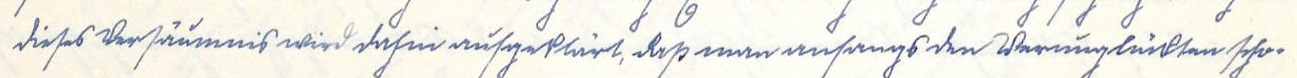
dieses Versäumnis wird dahin aufgeklärt, dass man anfangs den Verunglückten scho-
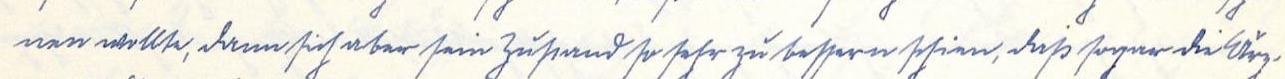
nen wollte, dann sich aber sein Zustand so sehr zu bessern schien, daß sogar die Ärz-
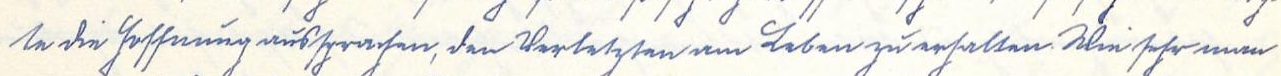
te die Hoffnung aussprachen, den Verletzten am Leben zu erhalten. Wie sehr man
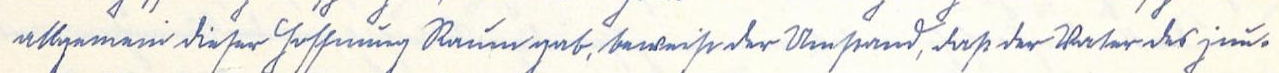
allgemein dieser Hoffnung Raumg ab, beweist der Umstand, dass der Vater des jun-
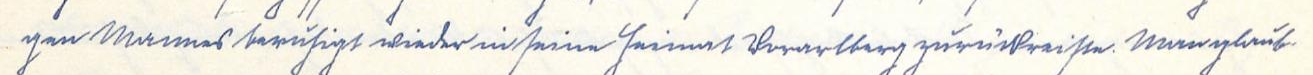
gen Mannes beruhigt, wieder in seiner Heimat Vorarlberg zurückreiste. Man glaub-
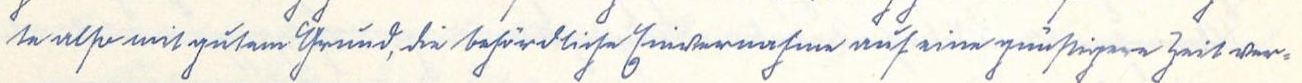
te also mit gutem Grund, die behördliche Einvernahme auf eine günstigere Zeit ver-
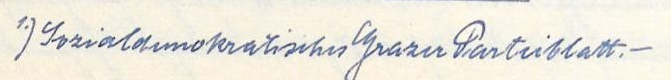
1) Sozialdemokratisches Grazer Parteiblatt.-
